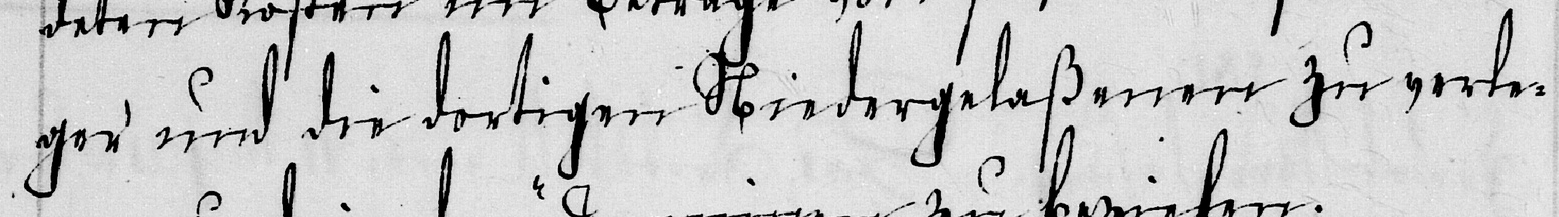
ger und die dortigen Niedergelaßenen zu verle¬
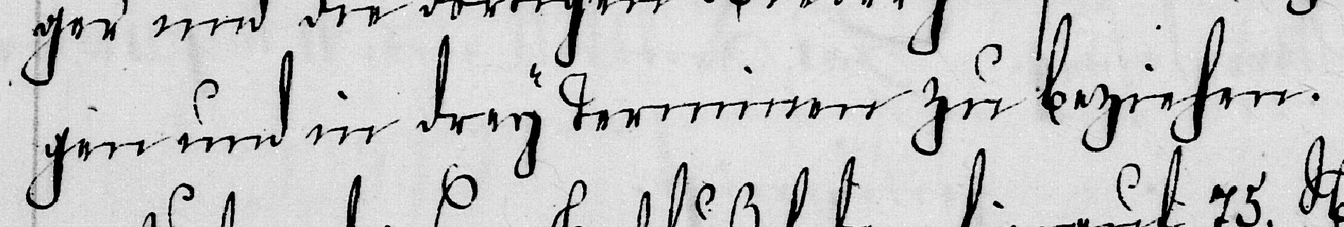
gen und in drey Terminen zu beziehen.
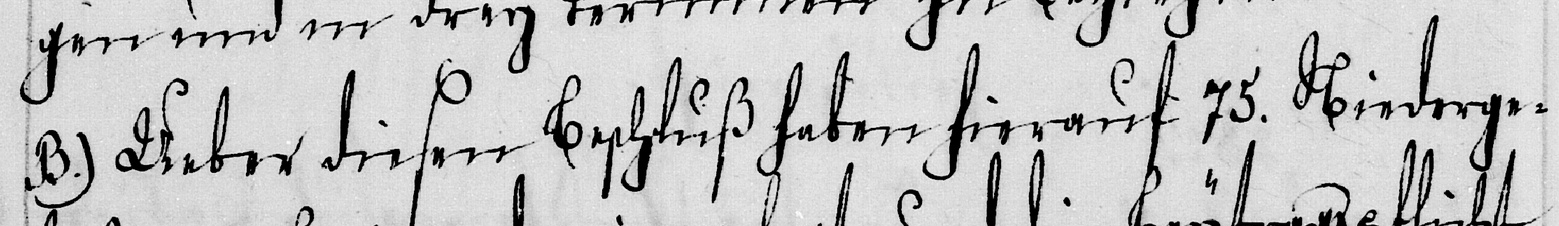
B.) Ueber diesen Beschluß haben hierauf 75. Niededer¬
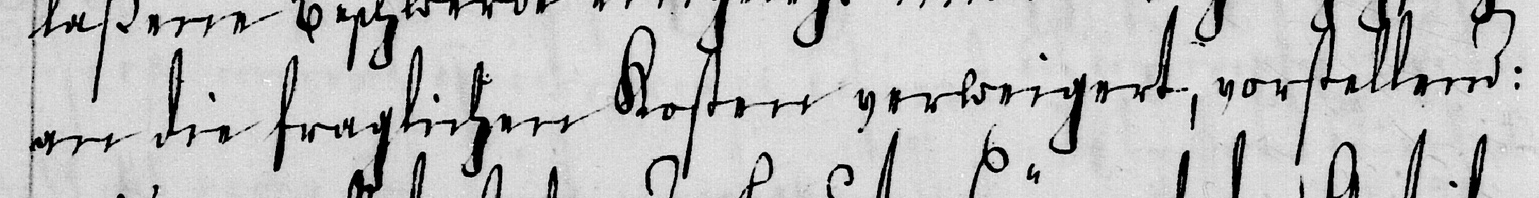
an die fraglichen Kosten verweigert, vorstellend:
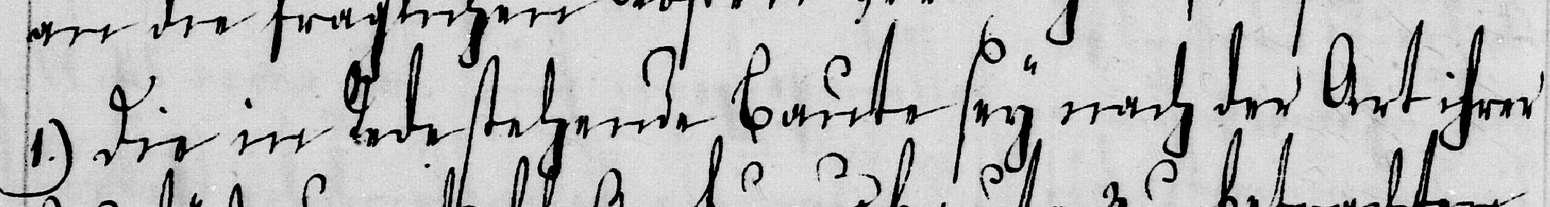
1.) Die in Rede stehende Baute sey nach der Art ihrer
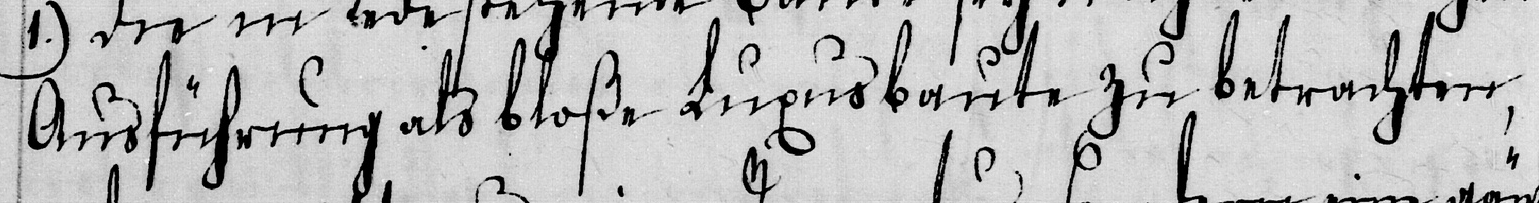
Ausführung als bloße Luxusbaute zu betrachten,
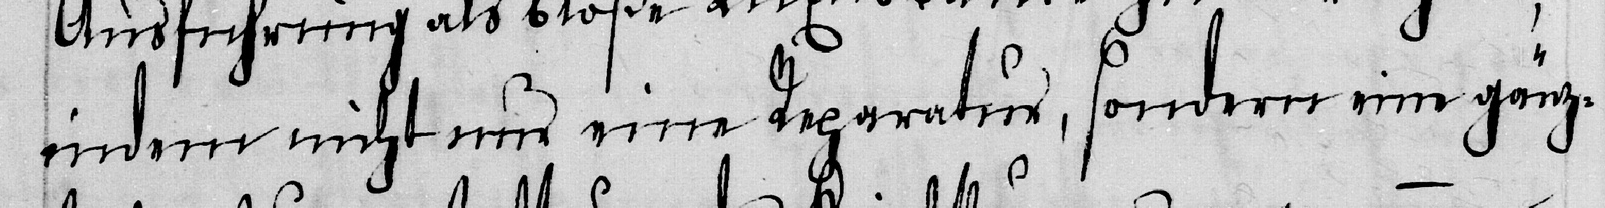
indem nicht nur eine Reparatur, sondern eine gänz¬
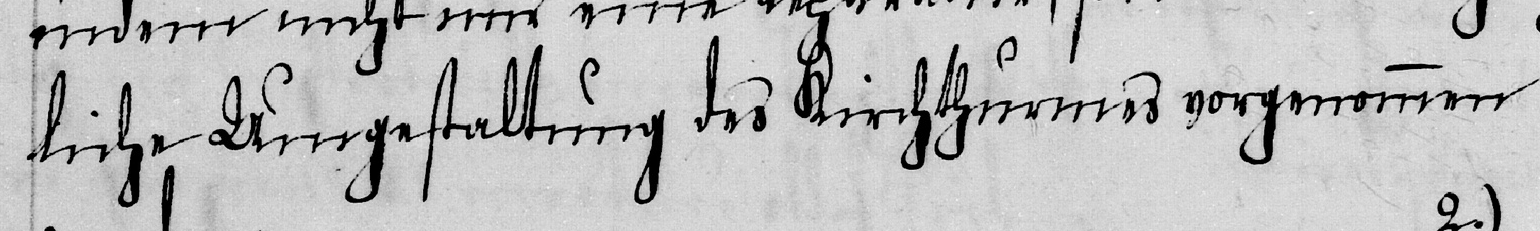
liche Umgestaltung des Kirchthurms vorgenommen
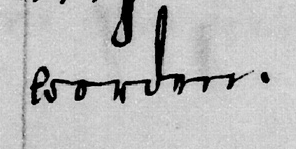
worden.
